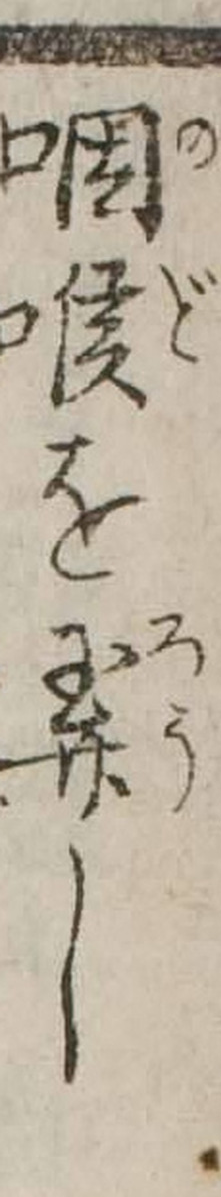咽喉を弄し
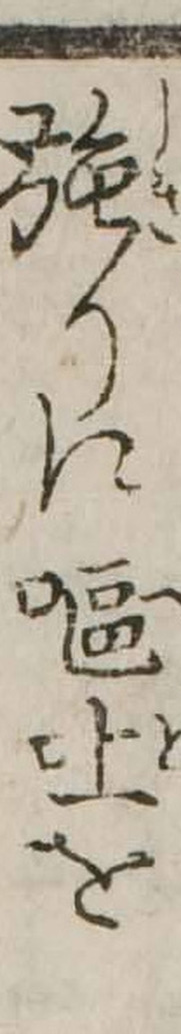強りに嘔吐を
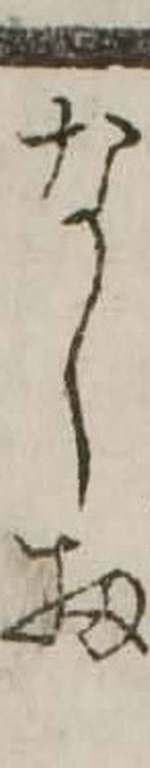なし扨
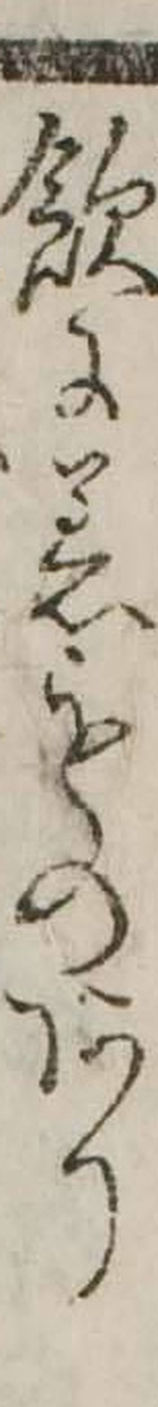飲に着ものあり
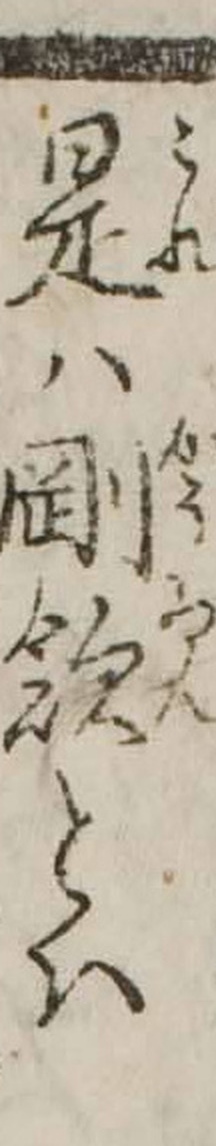是は剛飲とは
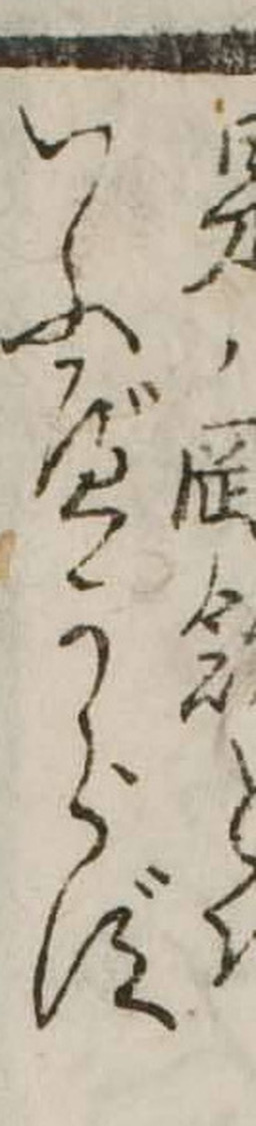いふべからず
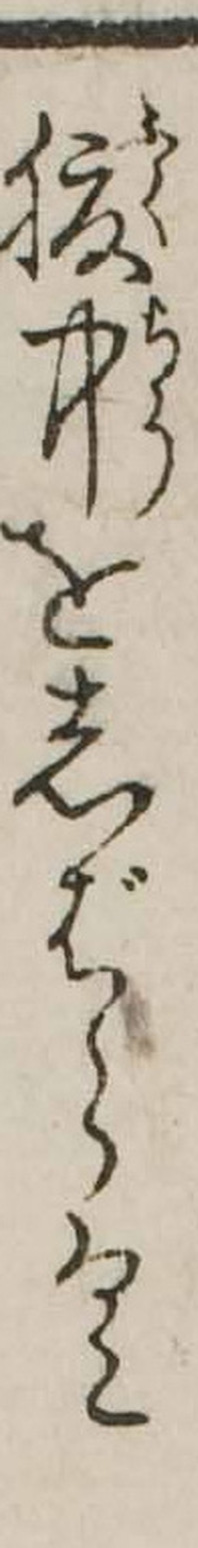腹中をしばらく
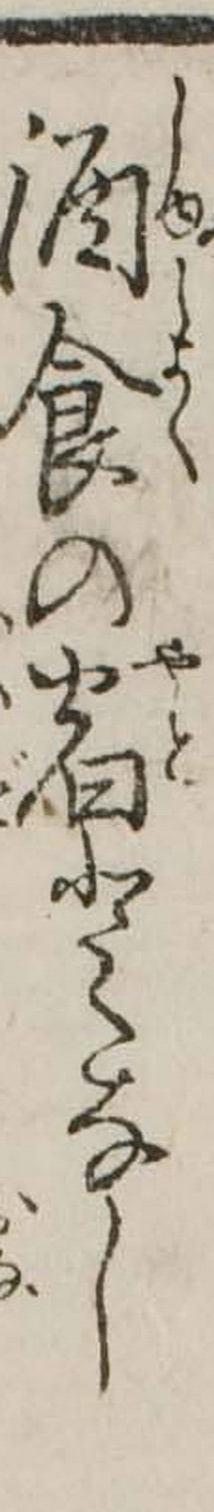酒食の宿となし
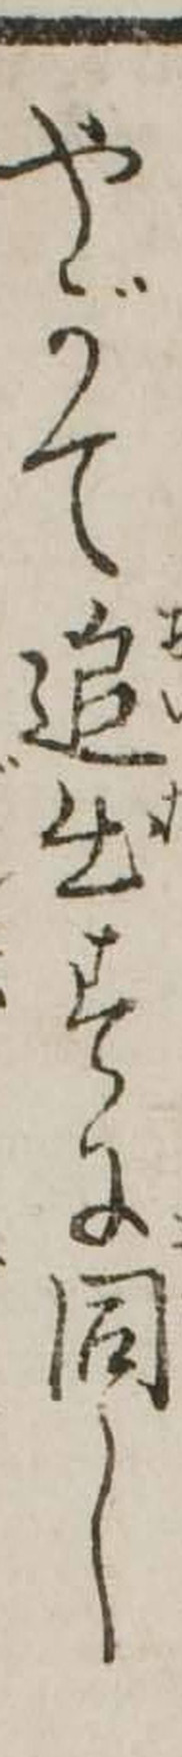やがて追出すに同し
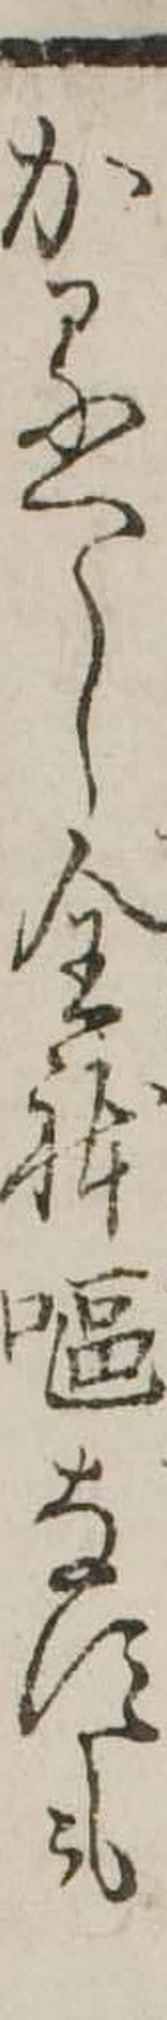かるへし全体嘔なすも
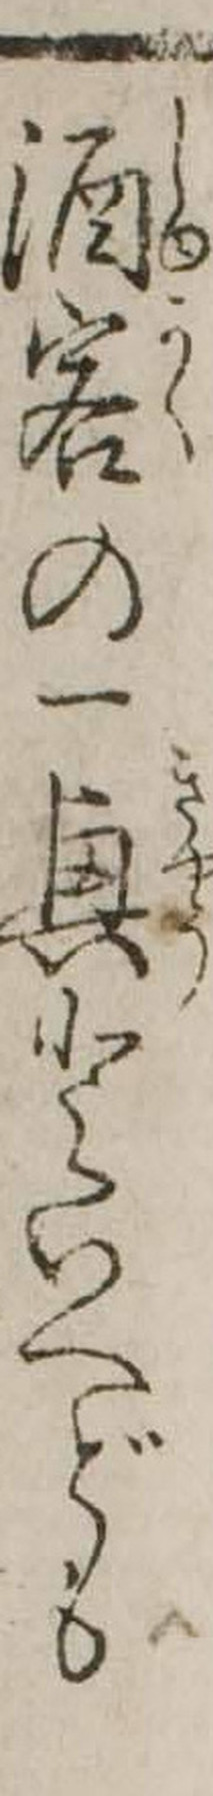酒客の一興といへども
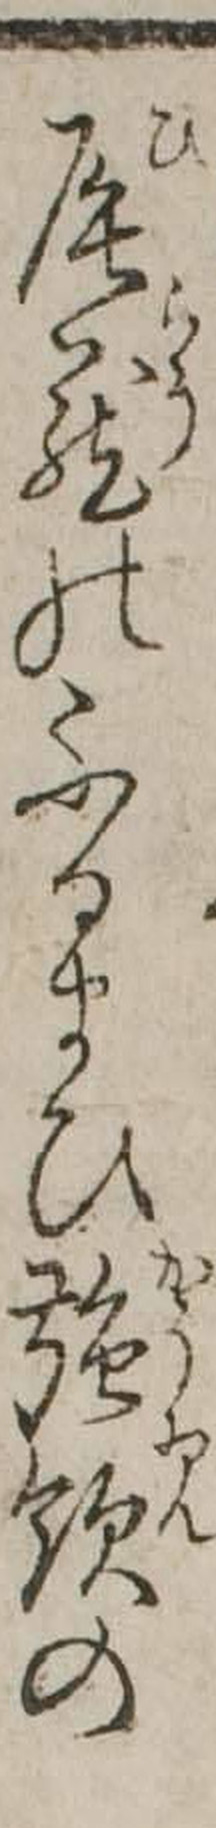尾籠のふるまひ強飲の
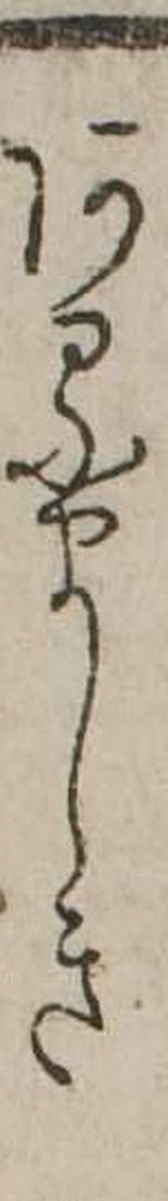あるましき

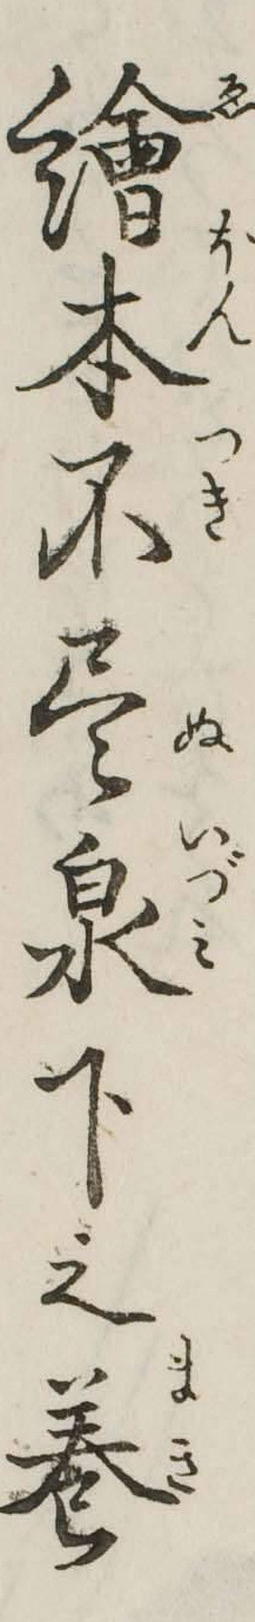絵本不尽泉下之巻

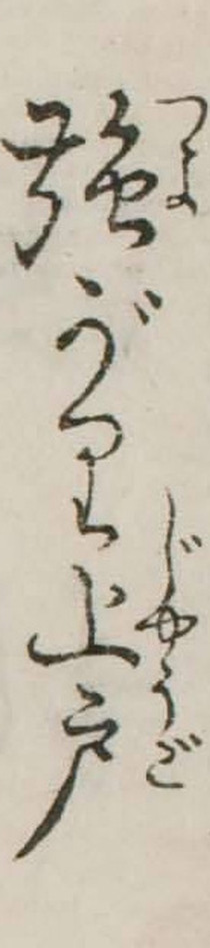強がり上戸
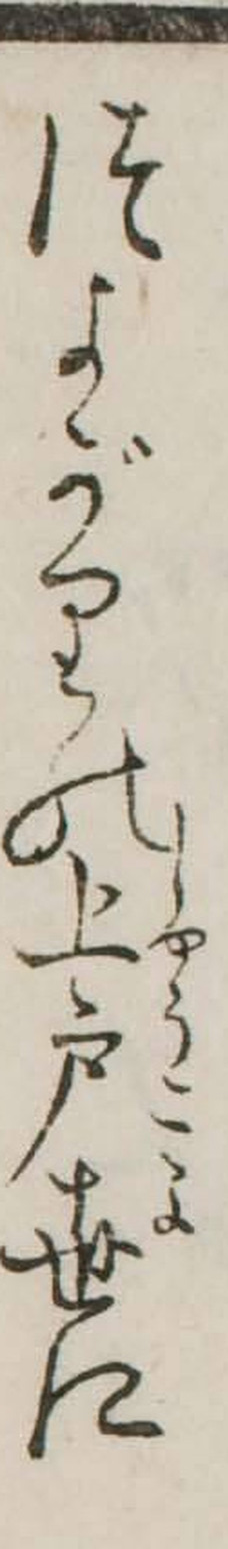つよがりの上戸世に
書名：繪本不盡泉
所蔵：国文学研究資料館
